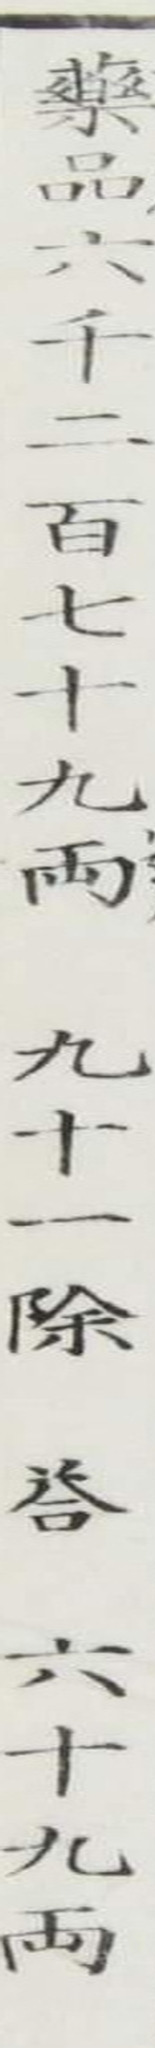薬品六千二百七十九両九十一除答六十九両
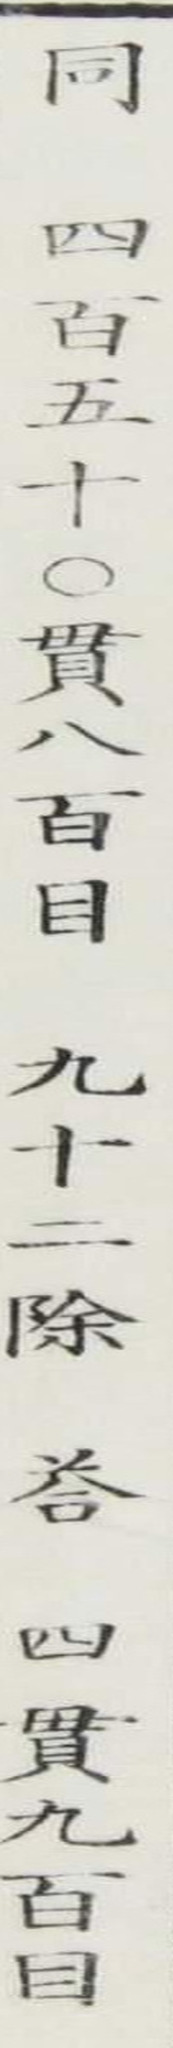同四百五十〇貫八百目九十二除答四貫九百目
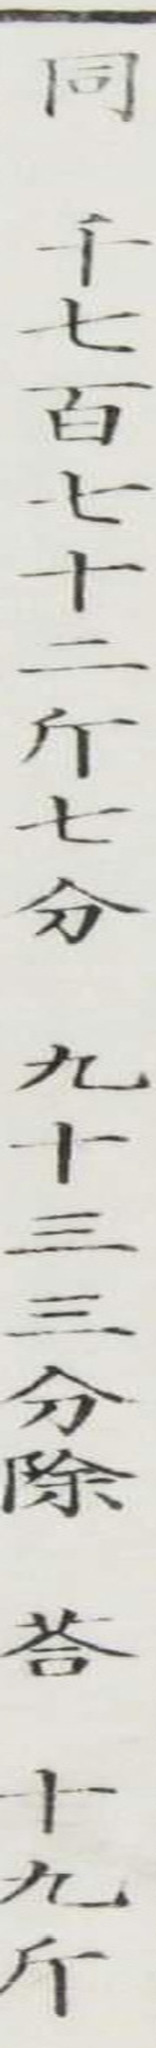同千七百七十二斤七分九十三三分除答十九斤
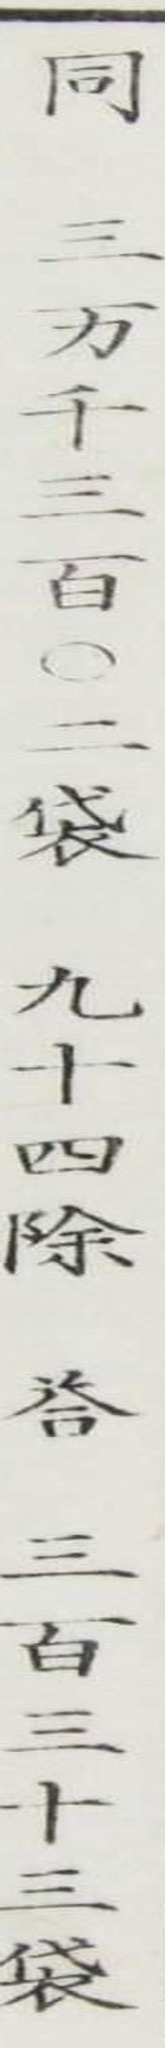同三万千三百〇二袋九十四除答三百三十三袋
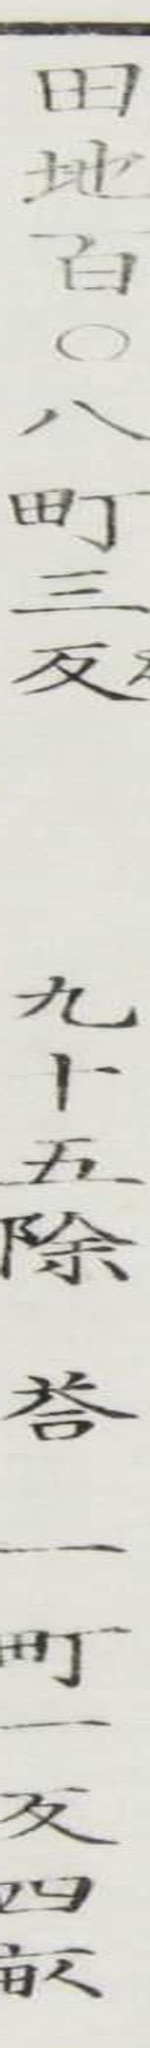田地百〇八町三反九十五除答一町一反四畝
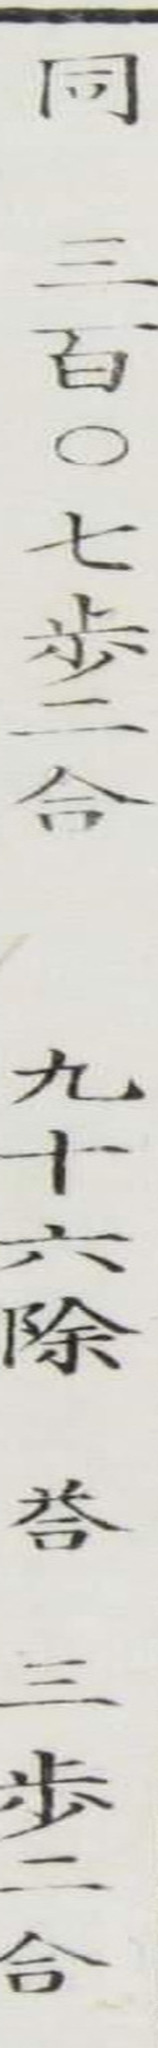同三百〇七分二合九十六除答三歩二合
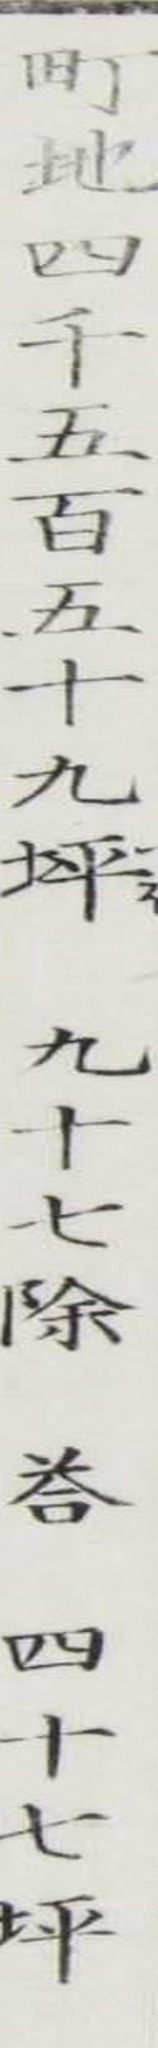町地四千五百五十九坪九十七除答四十七坪
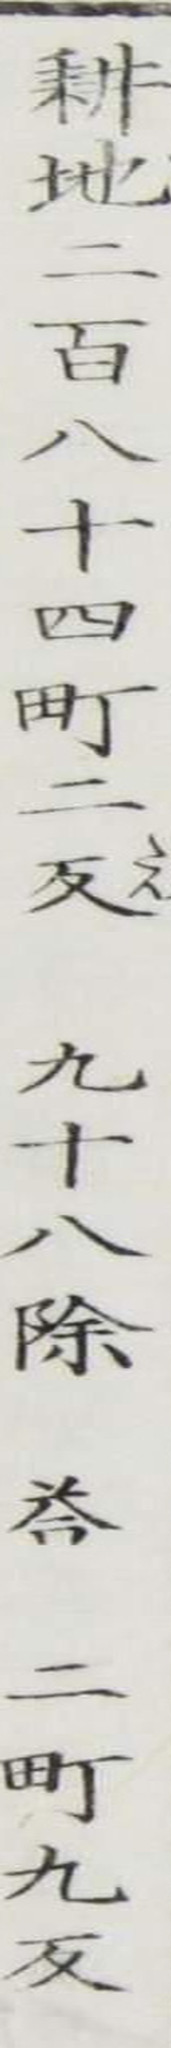耕地二百八十四町二反九十八除答二町九反
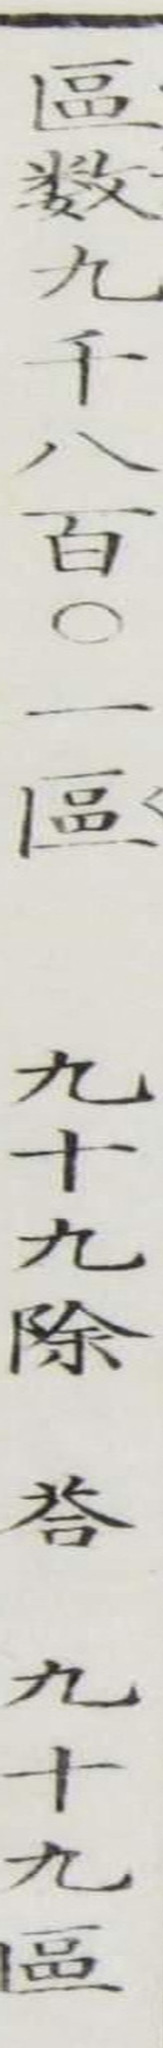区数九千八百〇一区九十九除答九十九区
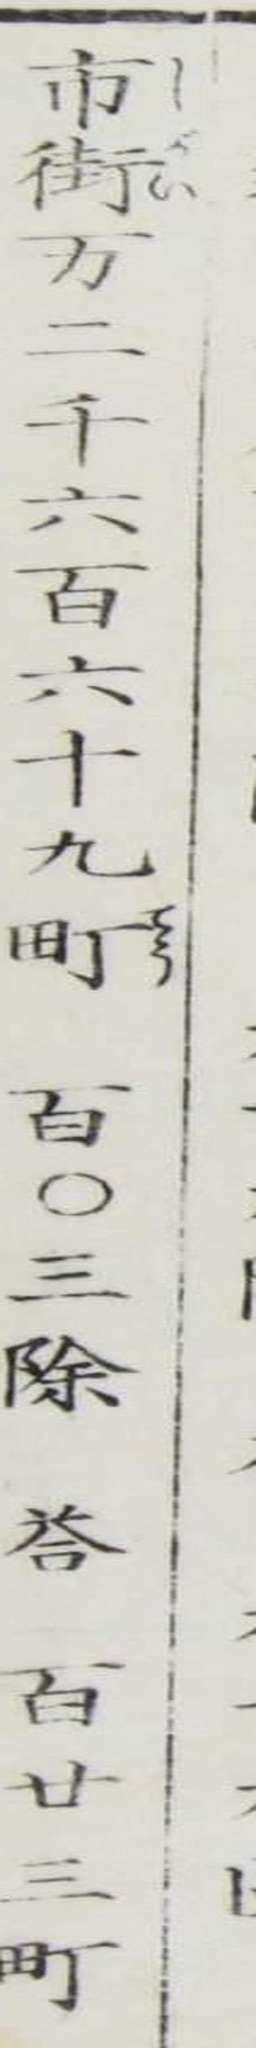市街万二千六百六十九町百〇三除答百廿三町

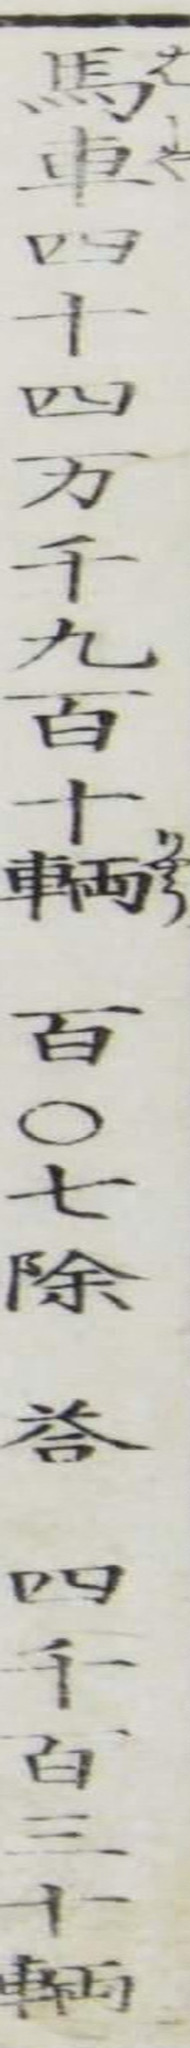馬車四十四万千九百十輌百〇七除答四千百三十輌
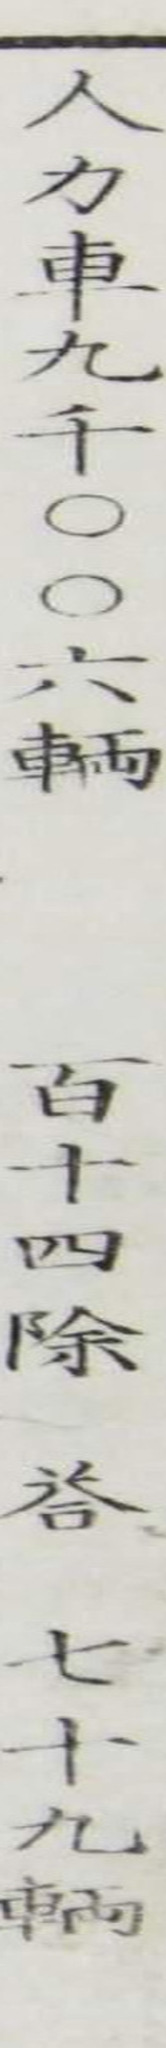人力車九千〇〇六輌百十四除答七十九輌
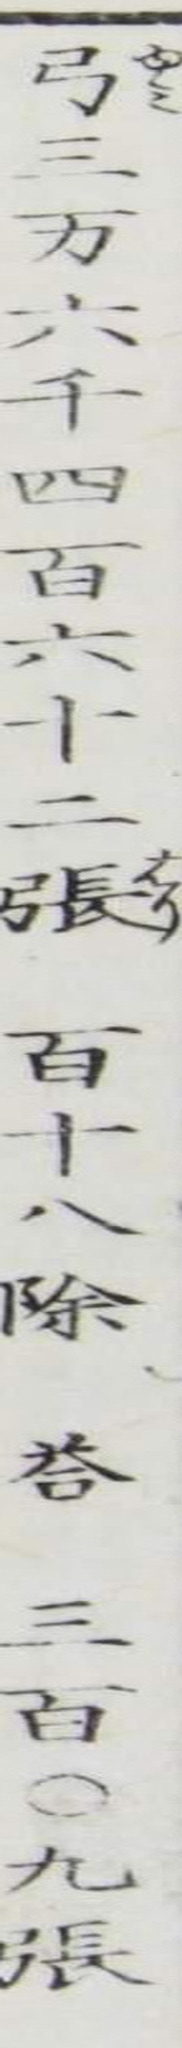弓三万六千四百六十二張百十八除答三百〇九張
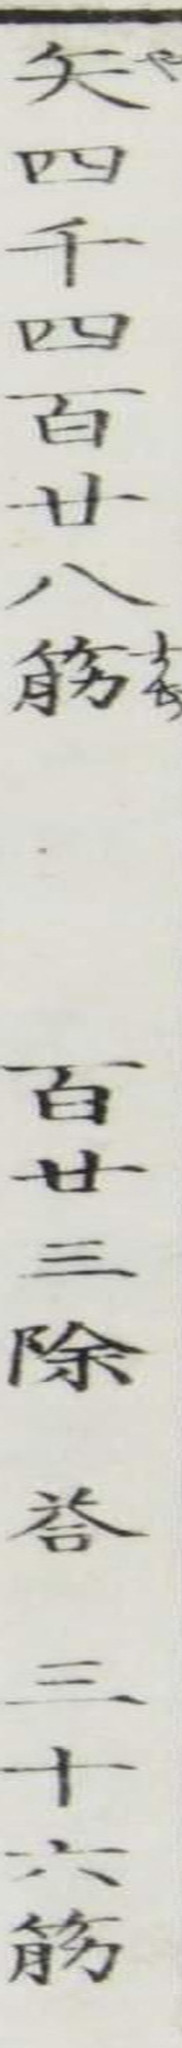矢四千四百廿八筋百廿三除答三十六筋
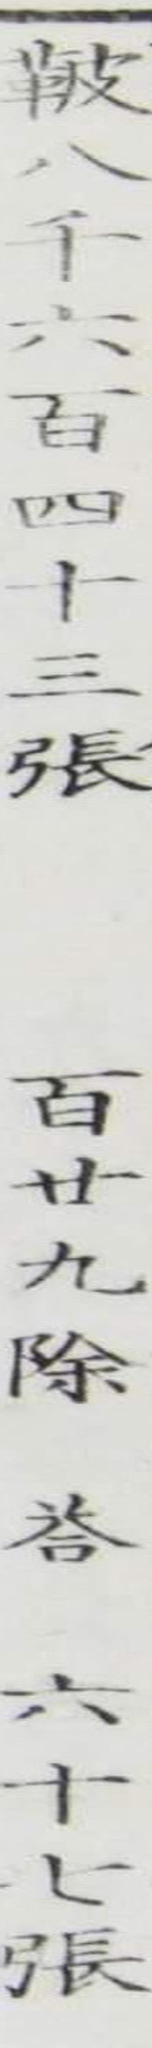鞁八千六百四十三張百廿九除答六十七張
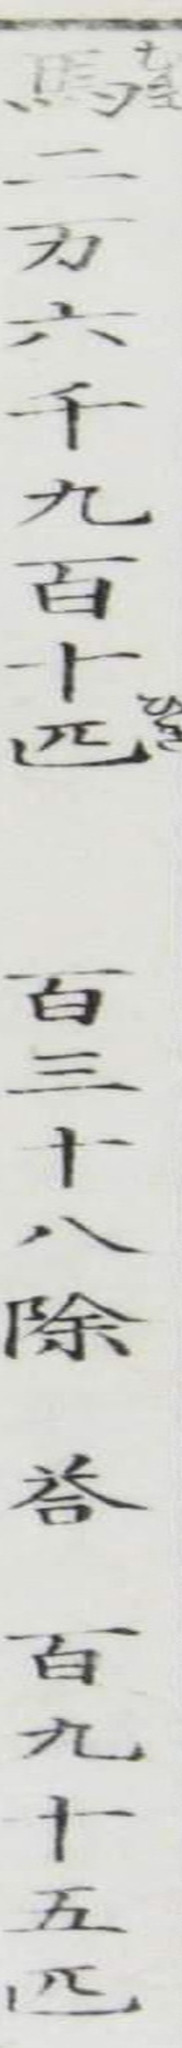馬二万六千九百十匹百三十八除答百九十五匹
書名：明治小學塵劫記 卷1
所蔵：東京学芸大学教育コンテンツアーカイブ
